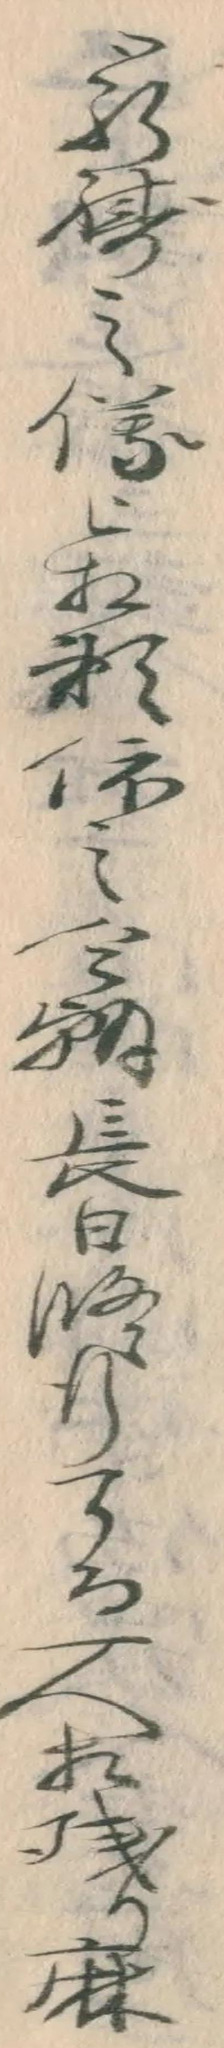御祈祷之儀被相頼依之今朝長日修行了而一人相残り麻
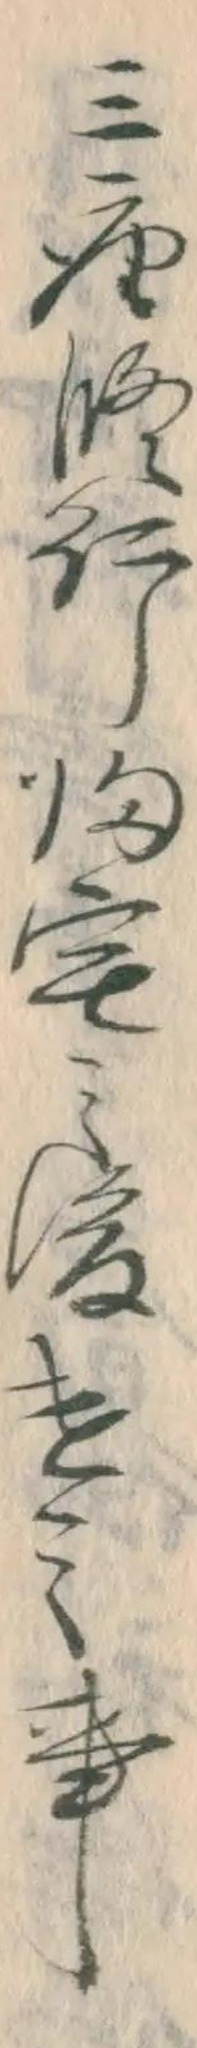三座修行帰宅之後遣之事
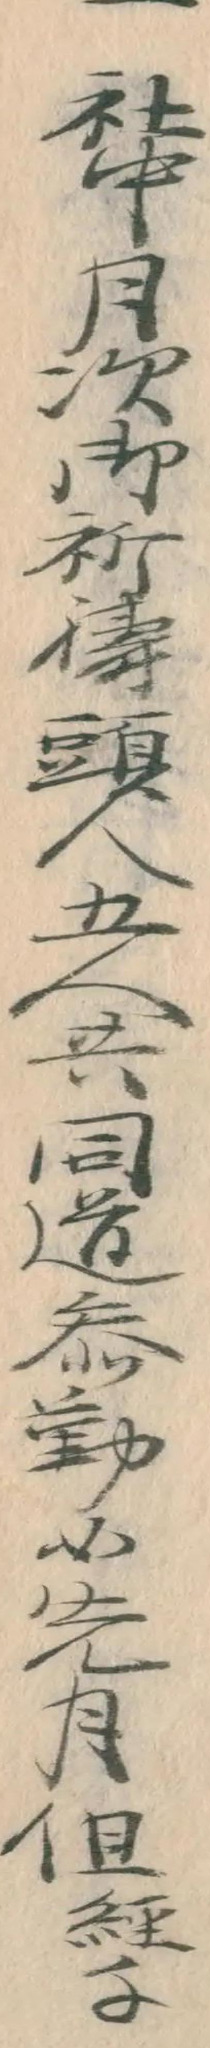一社中月次御祈祷頭人五人共同道参勤如先月但経千

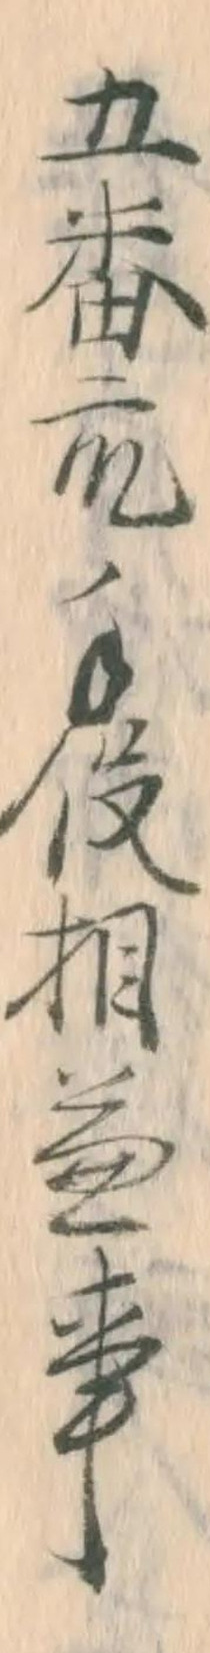五番衆手役相兼事
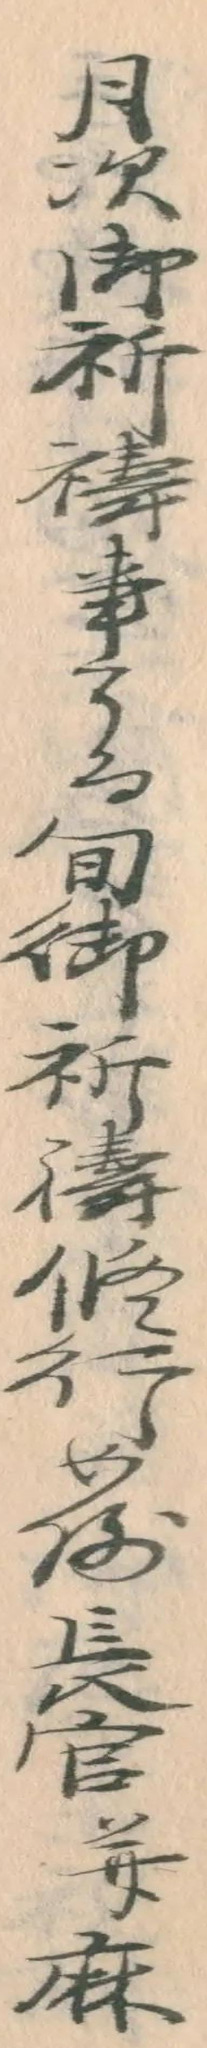一月次御祈祷事了而旬御祈禱修行如例長官幷麻
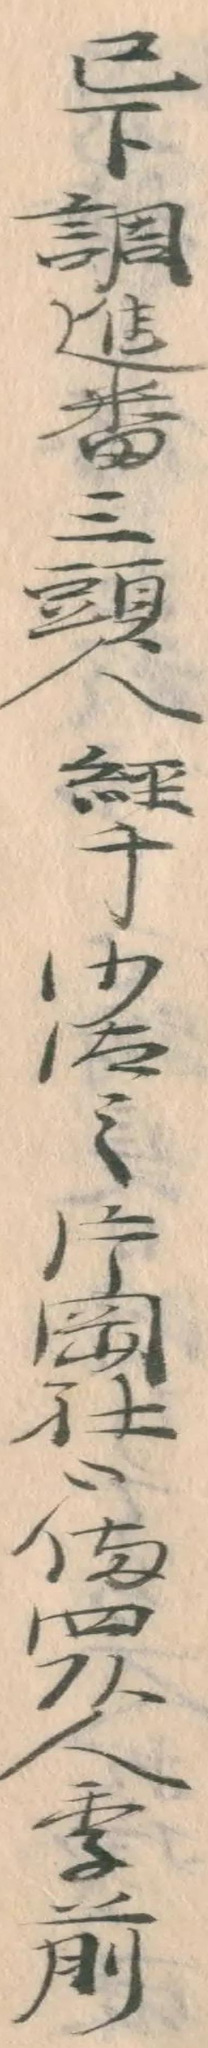已下調進番三頭人経千沙汰之片岡社御備四頭人季前
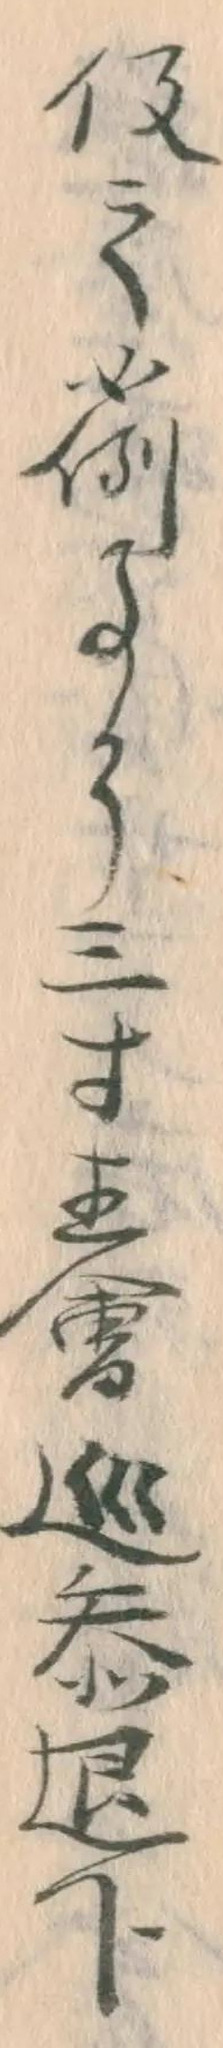役之如例事了三寸直會巡参退下
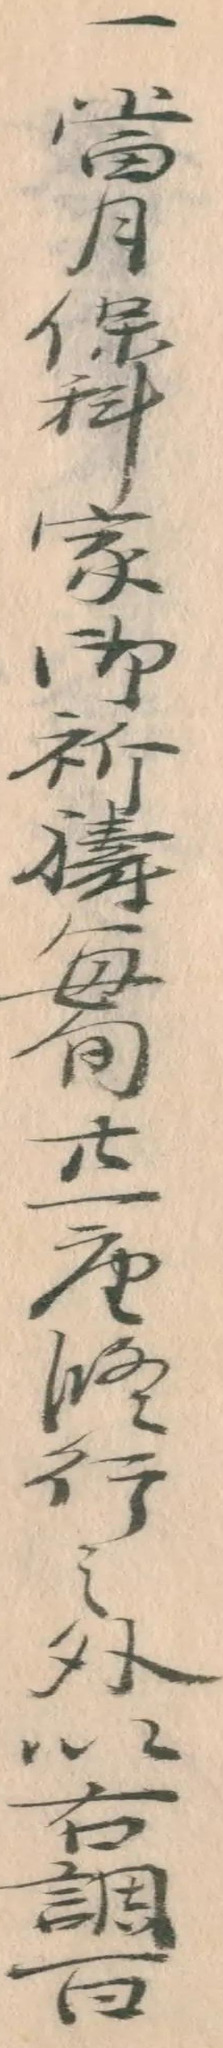一當月保科家御祈祷毎旬廿一座修行之外以古調百
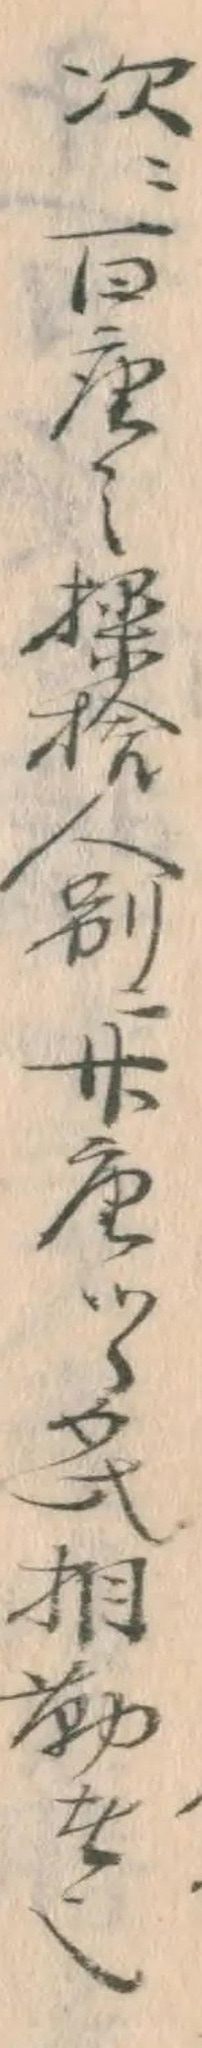次ニ百座之操捨人別ニ廿座ツヽ如此相勤者也
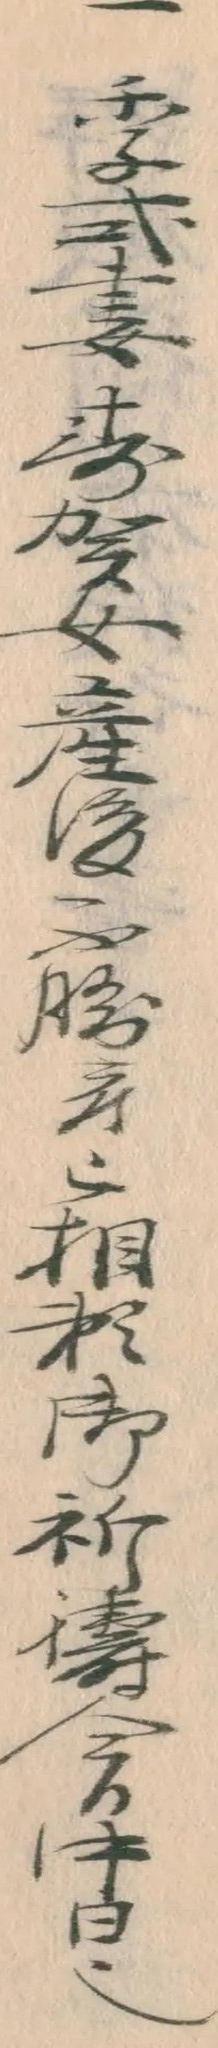一季式妻寿賀女産後不勝ニ付被相頼御祈祷今日中日也
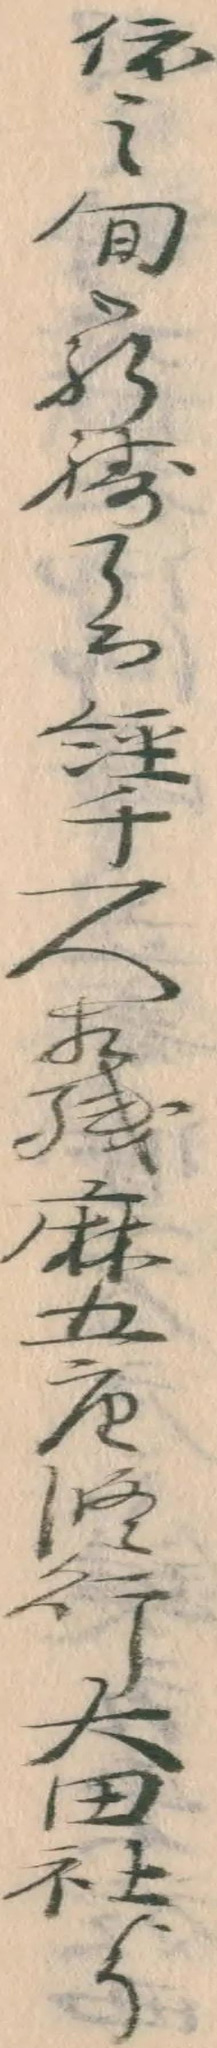依之旬御祈祷了而経千一人相残麻五座修行大田社より
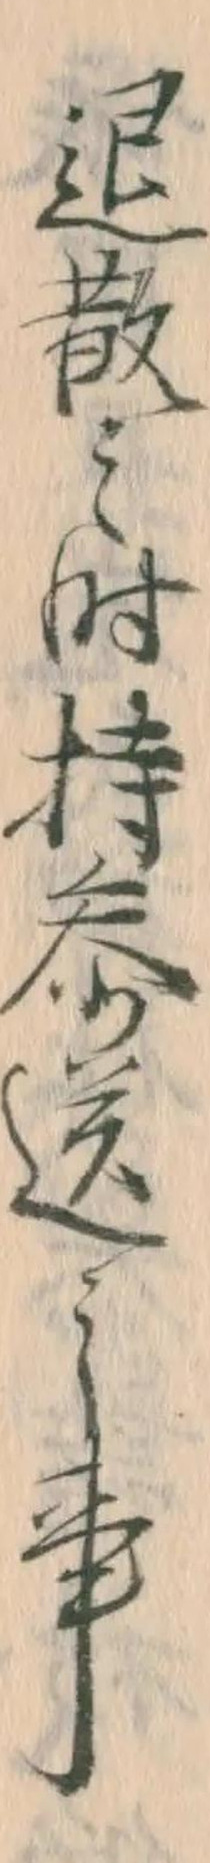退散之時持参送之事
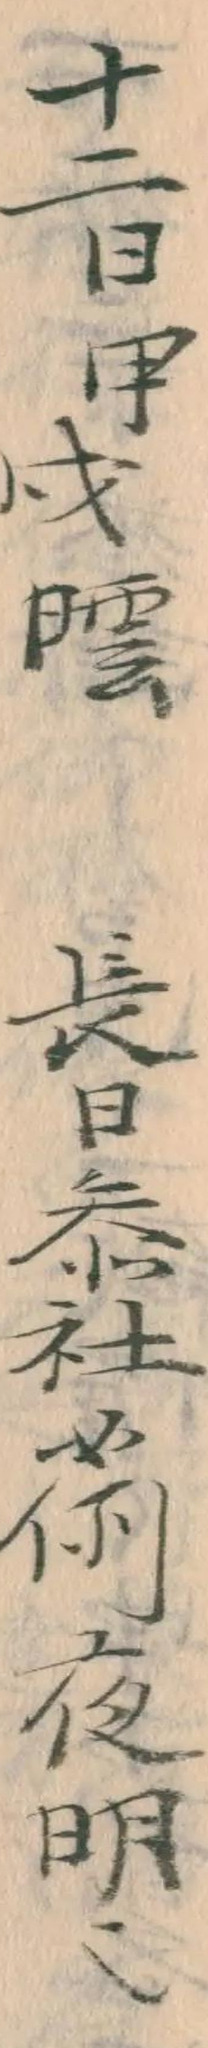十二日甲戌曇長日参社如例夜明也
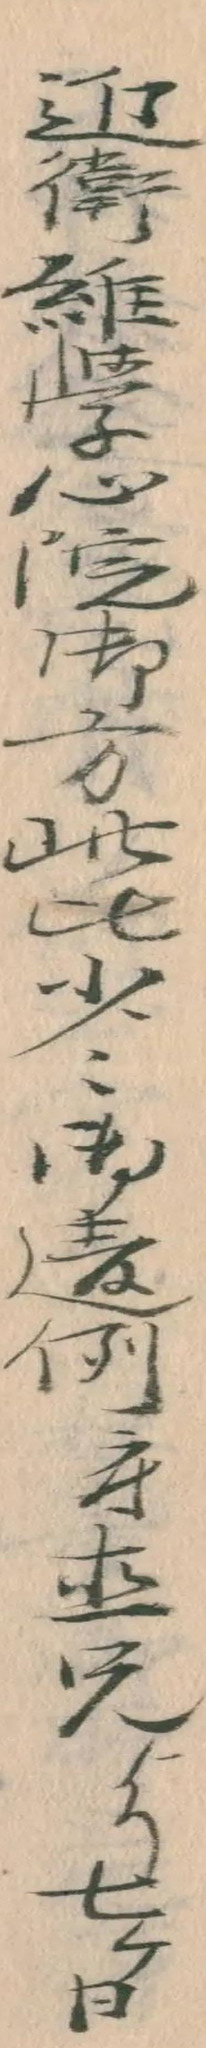一近衛維學心院御方此少々御違例ニ付直兄より七ケ日
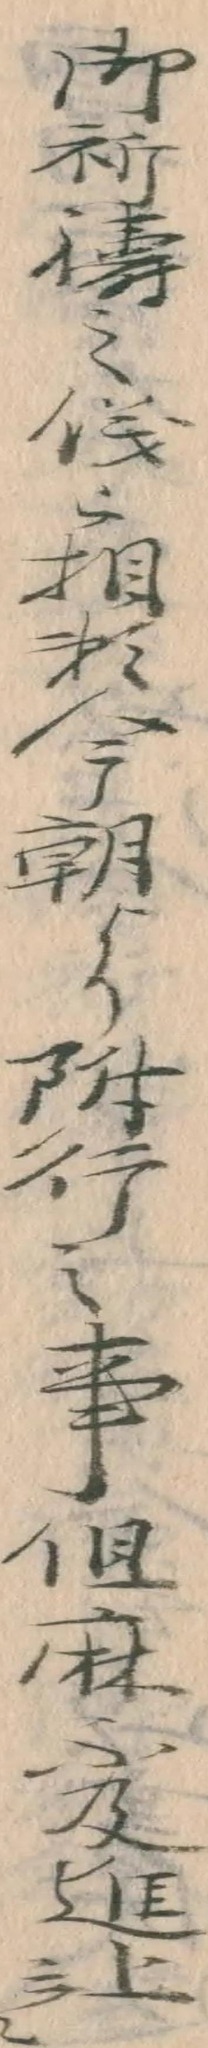御祈祷之儀被相頼今朝より附行之事但麻不及進上云々
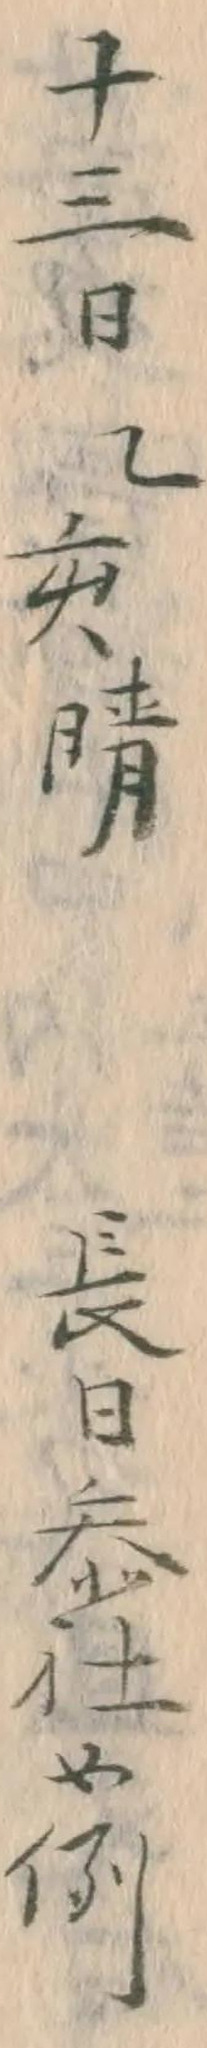十三日乙亥晴長日参社如例
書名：賀茂社記録. 第73冊
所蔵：国立国会図書館 National Diet Library, JAPAN
